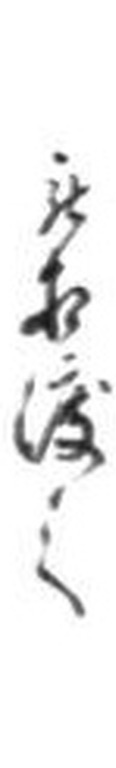被相渡之
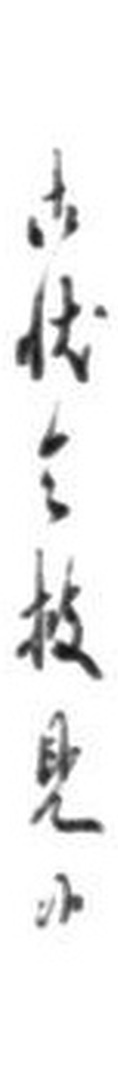御状令披見候
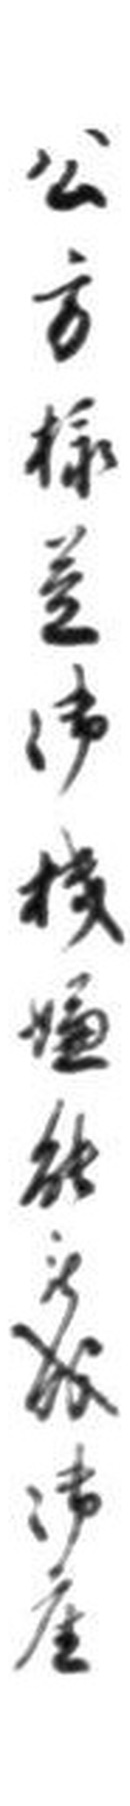公方様益御機嫌能被成御座
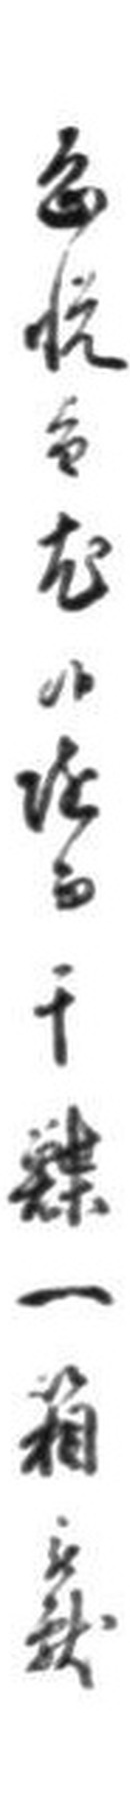恐悦旨尤候随而干鰈一箱被献
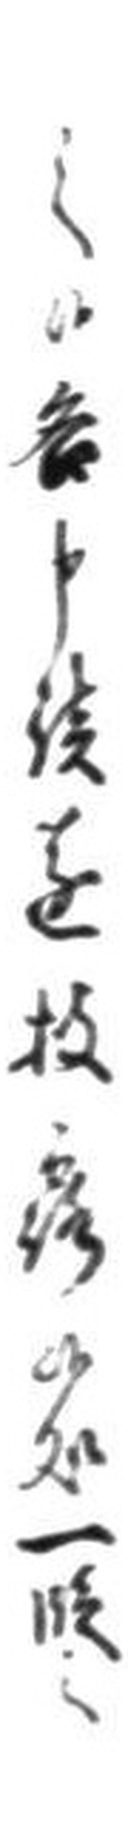之候各申談遂披露候処一段之
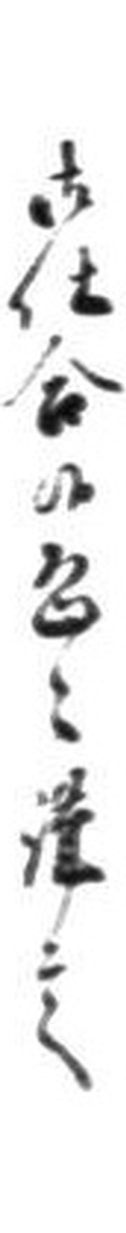御仕合候恐々謹言
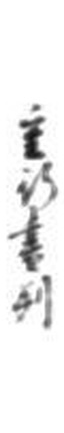重行書判
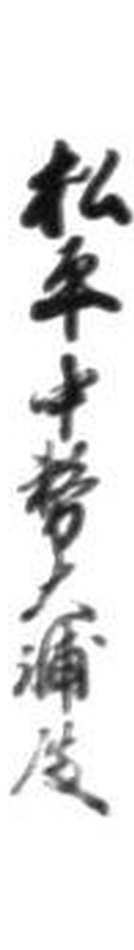松平中務大輔殿

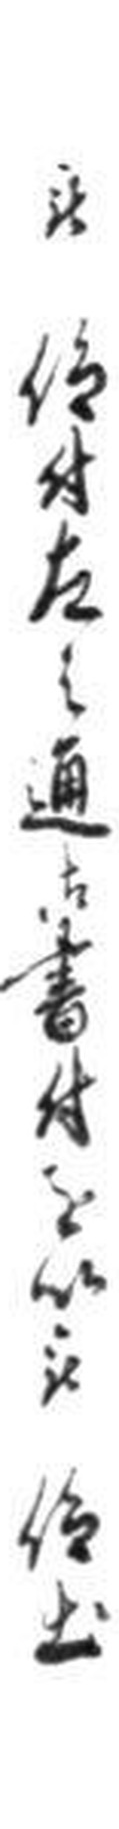被仰付左之通御書付を以被仰出
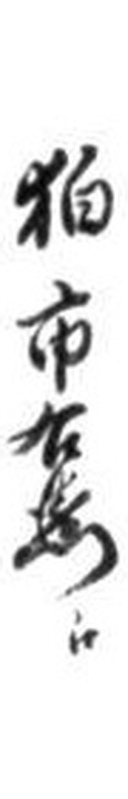狛市右衛門江
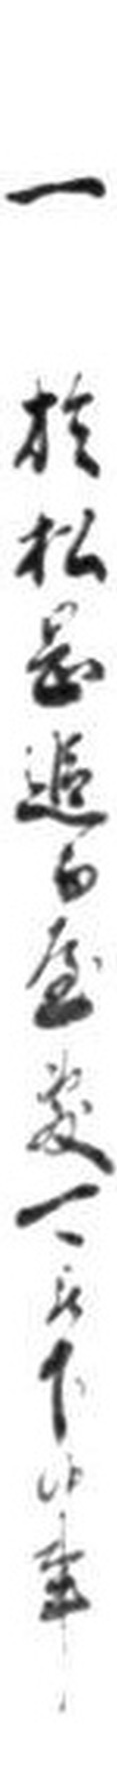一於松岡追而屋敷可被下候事
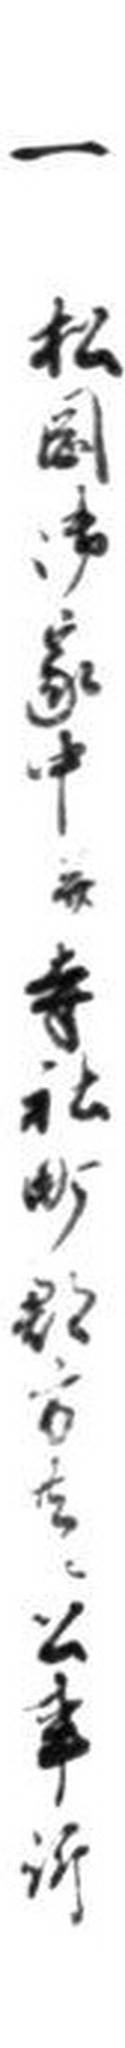一松岡御家中并寺社町郡方共ニ公事訴
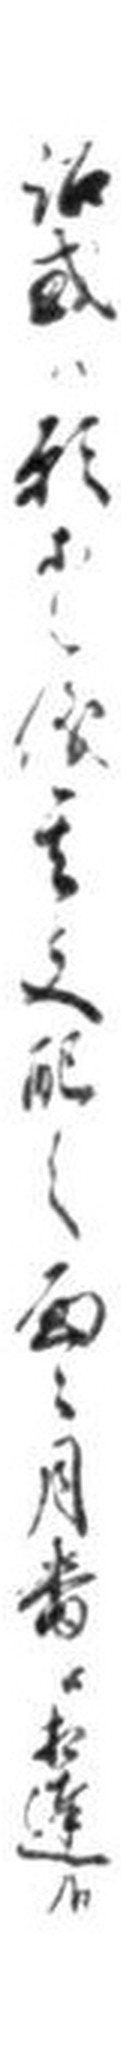詔或ハ願等之儀其支配之面々月番江相達候
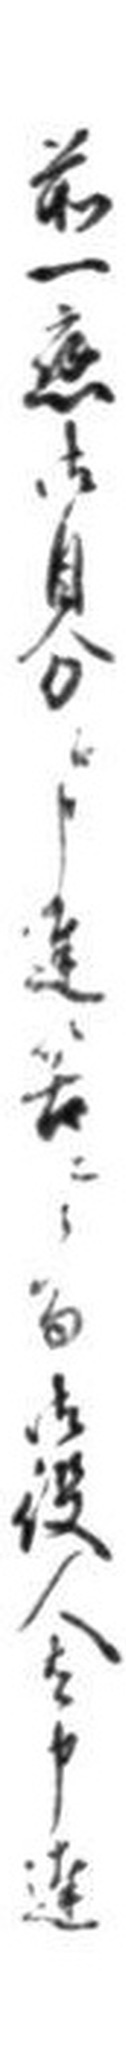前一応御自分江申達筈ニ候間御役人共申達
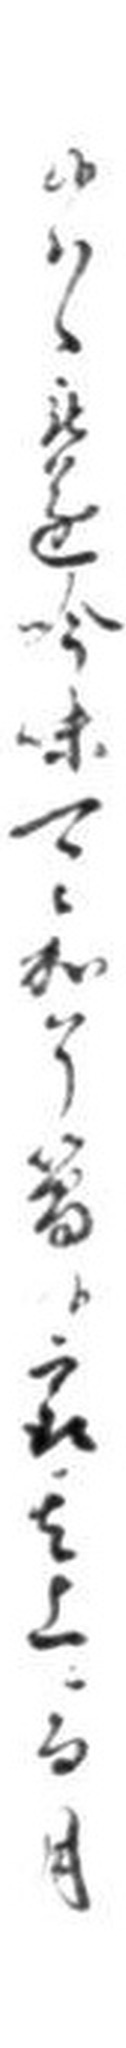候ハヽ被遂吟味可被加了簡候最其上ニ而月
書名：家譜 三十六 宗昌公 従享保八年到同九年
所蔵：福井県文書館 Fukui Prefectural Archives
